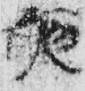寅
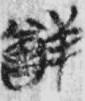○（矰）
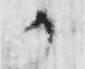人
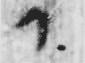人
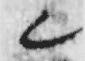乙
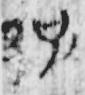○（枝）
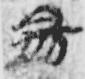昜（陽）
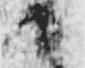人
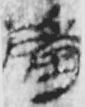○（陳）
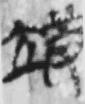坡
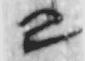己
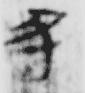丑
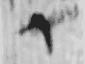人
